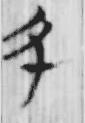丑
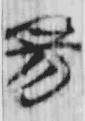昜（陽）
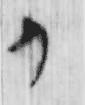人
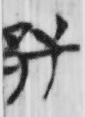邗
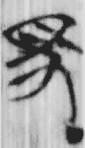○（得）
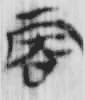丙
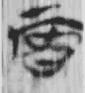丙
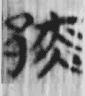郯
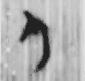人
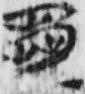芻
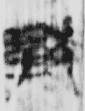獸
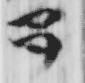邑
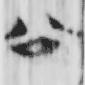公
